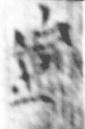鈎
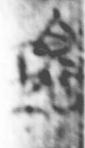環
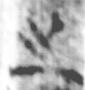之
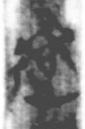○（路）
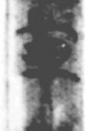車
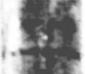二
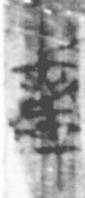𨍱（乘）
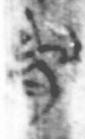削
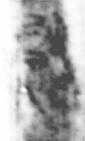敗
